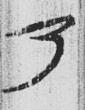乃
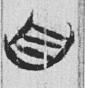自
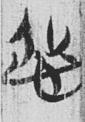○（過）
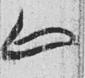㠯（以）
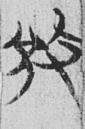敓（悅）
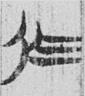於
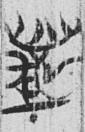○（萬）
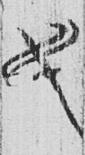民
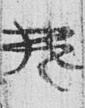弗
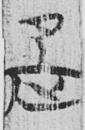危
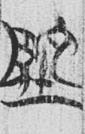地
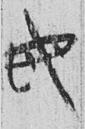母
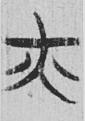亦
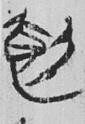○（食）
